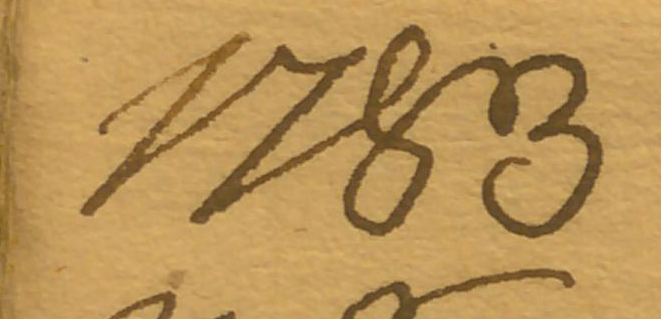1783
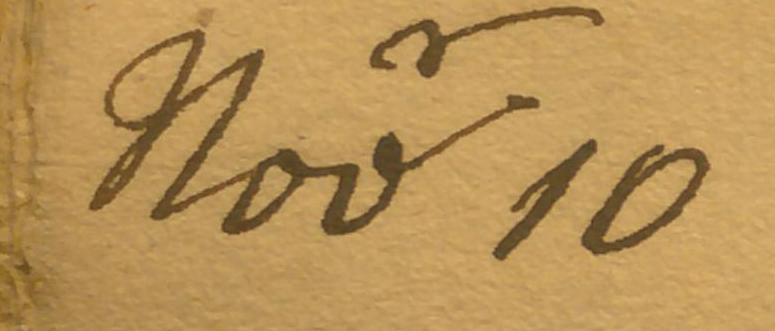Nov^r 10
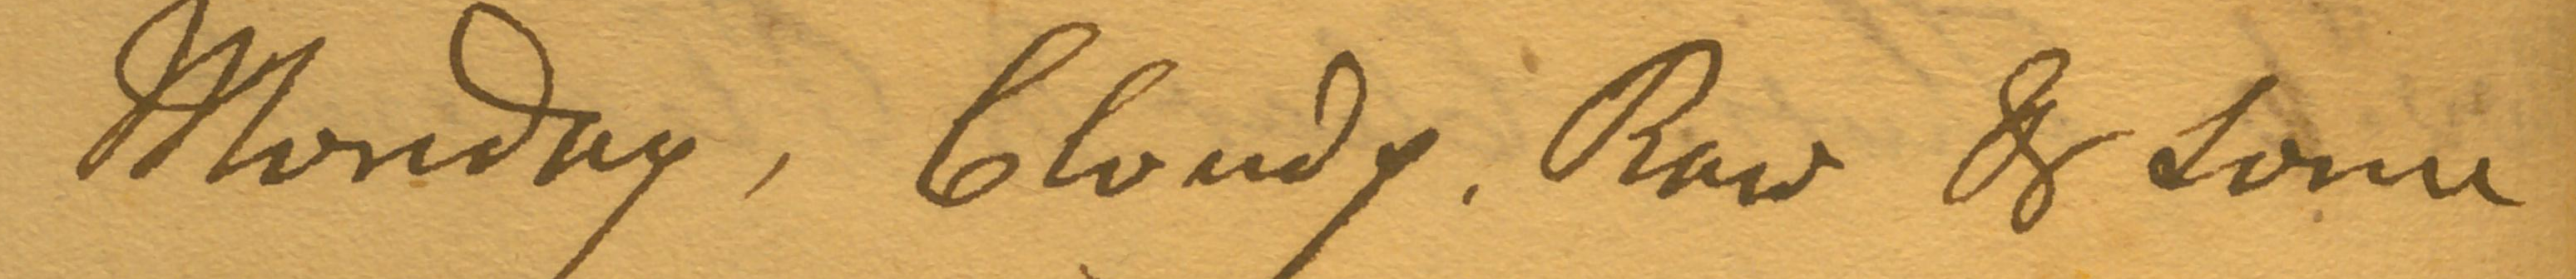Monday, Cloudy. Raw & some
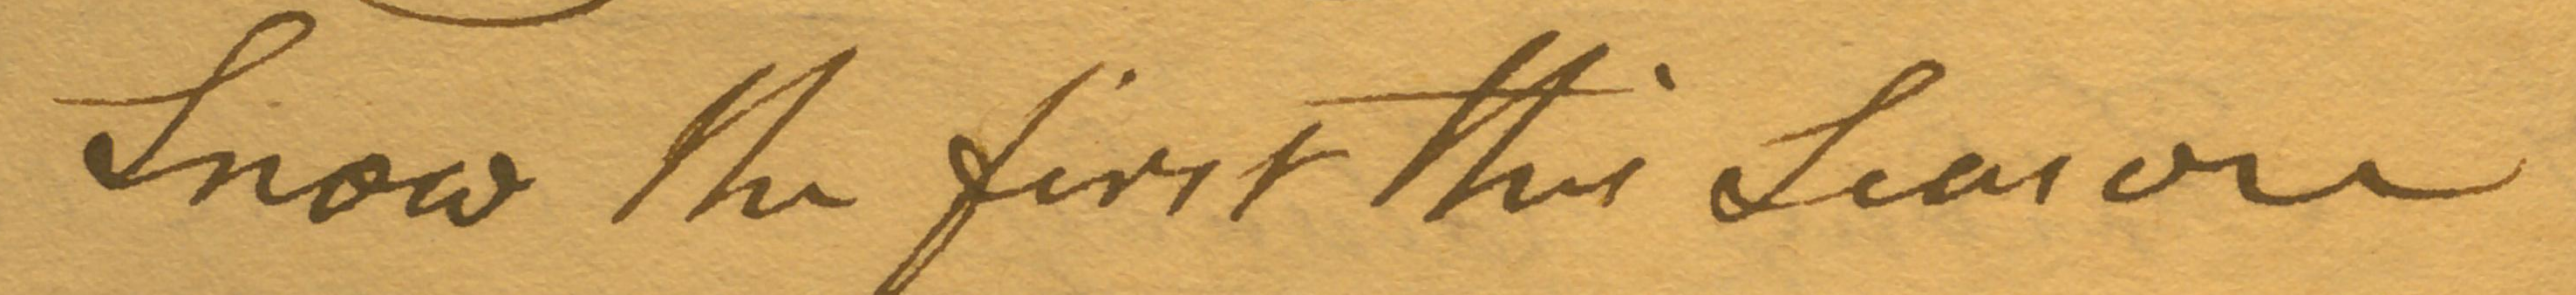Snow the first this season
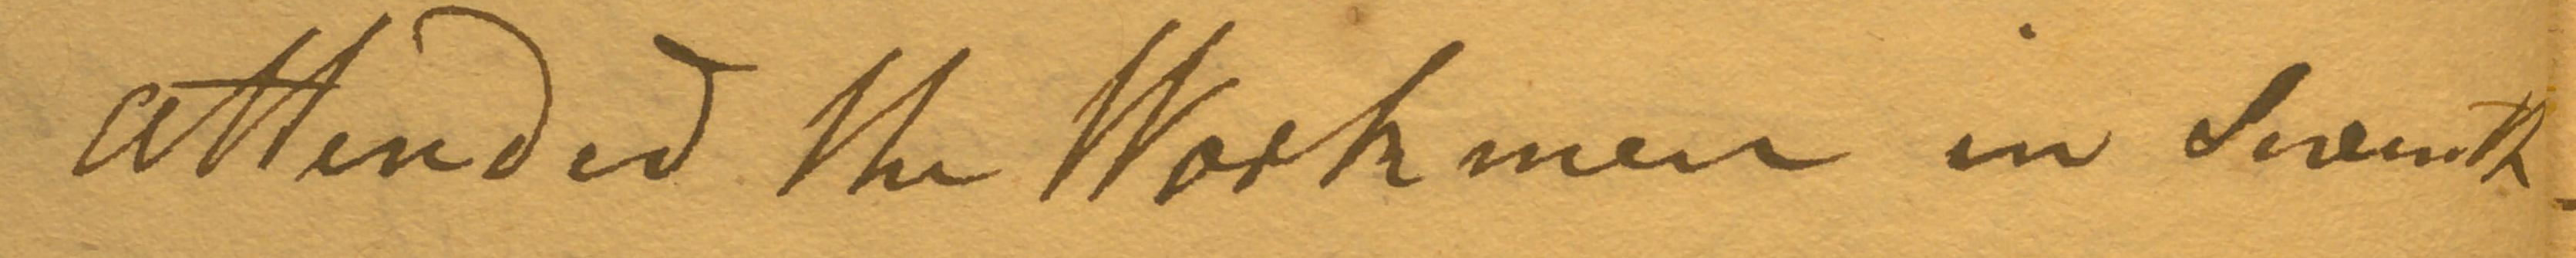attended the Workmen in seventh
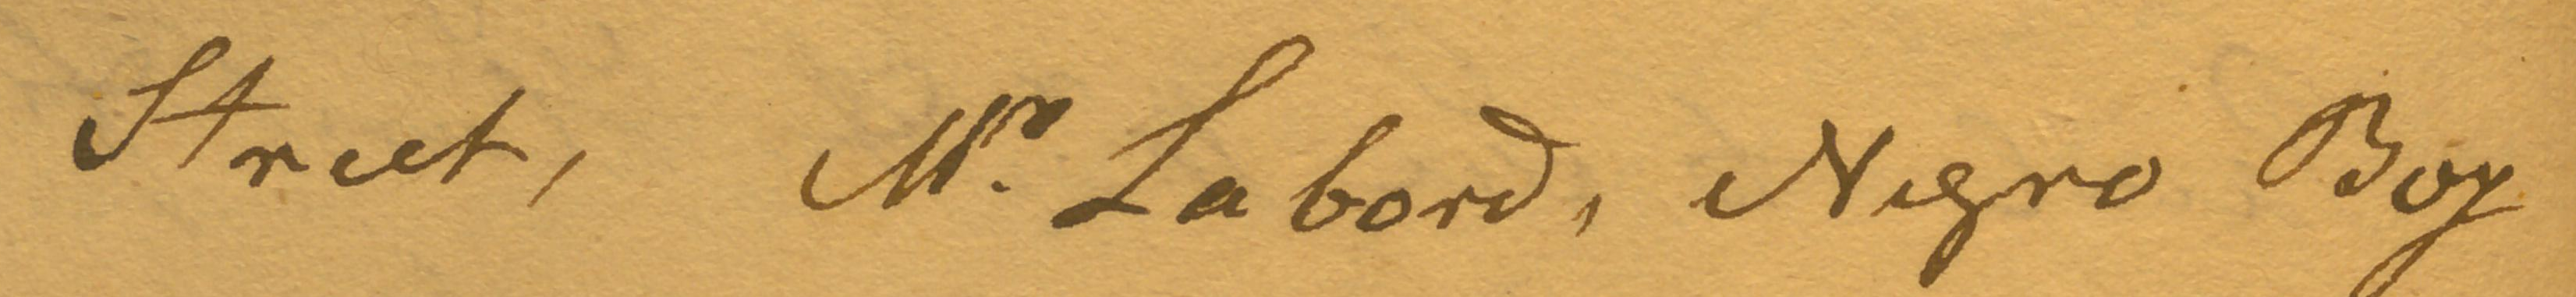Street, M^r. Labord, Negro Boy
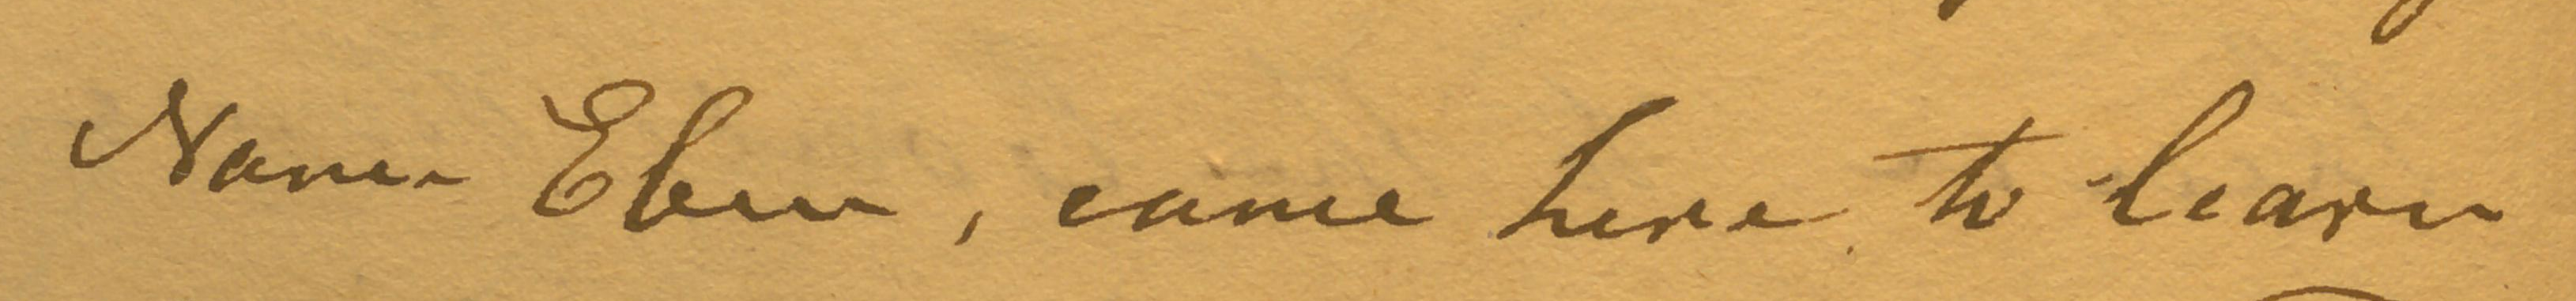Name Eben, came here to learn
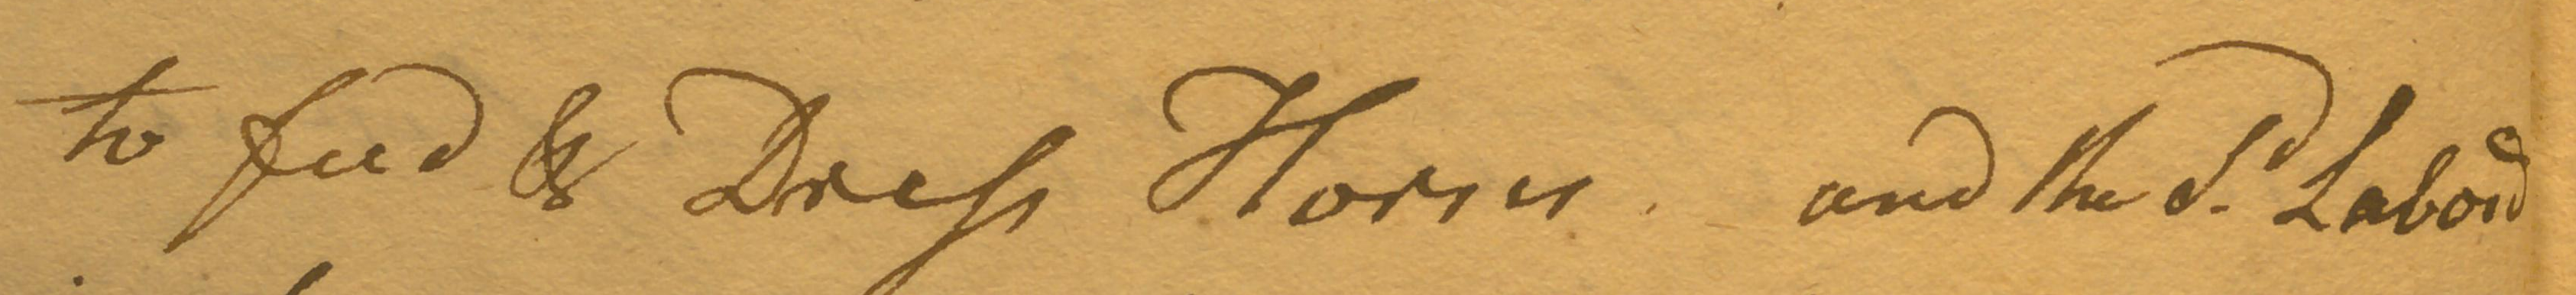to feed & Dress Horses, and the s^d. Labord
